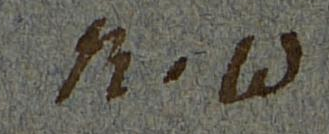R. W
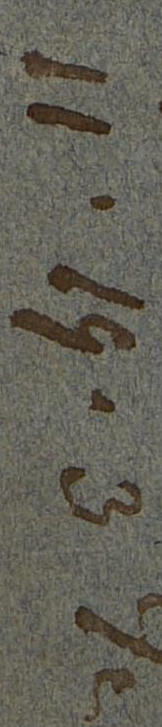11. 19 . 3 1/2
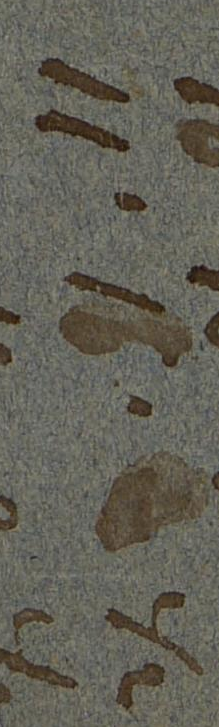11.1[_].[_] 1/2
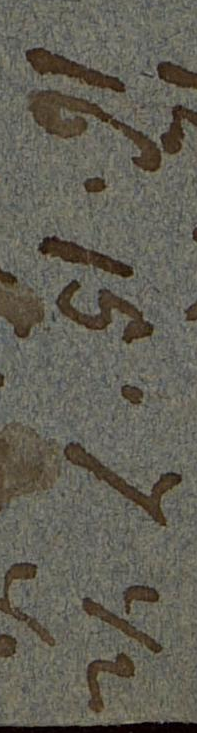16.15.7 1/2
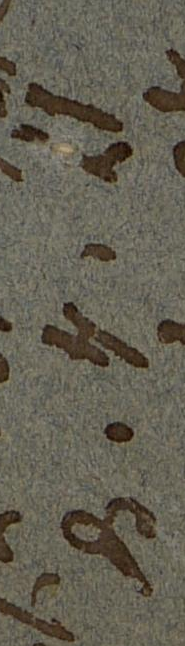17.4.8
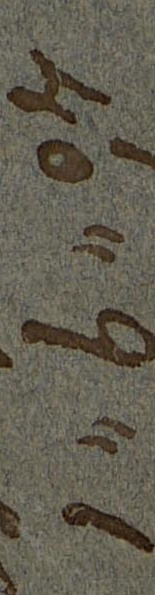40"9"1
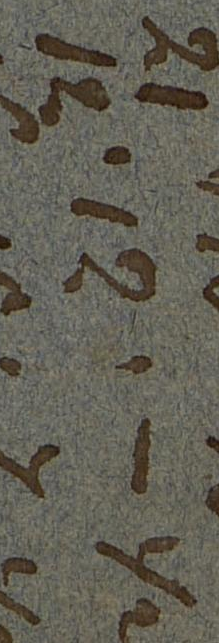12.12.- 1/2
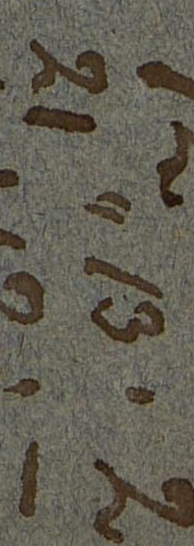21"13.2
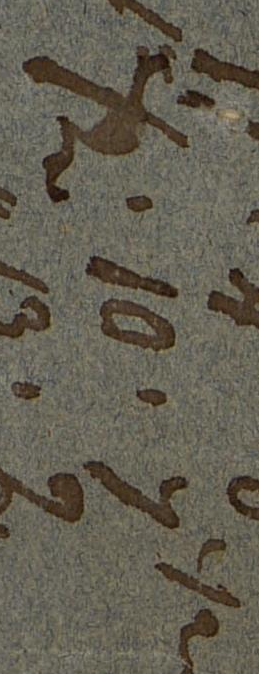12 .10.7 1/2
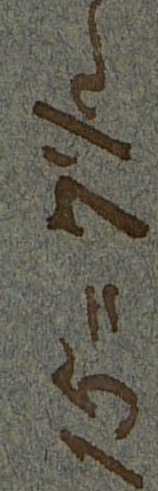15=7 1/2
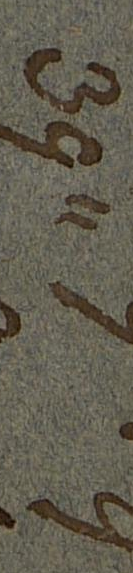30"7.9
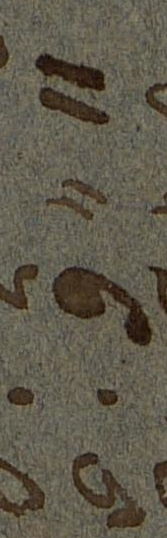11"6.5
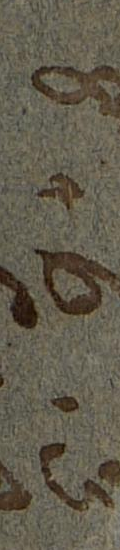8"6.3
